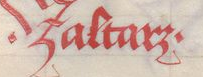.Zaltarz.
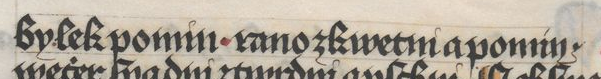bylek pomin.rano zkwetni a pomin.
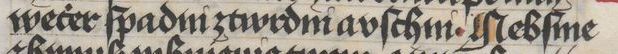weċer ſpadni ztwrdni a uſchni.Nebſme
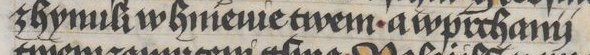zhynuli whnieuie twem.a wprchanij
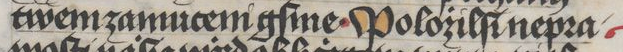twem zamuceni gſme.Polożilſi nepra¬
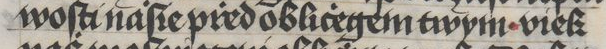woſti naẛie pṙed obliċegem twym.viek
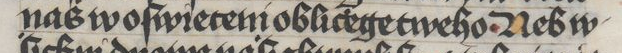naṡ w oſwieceni obliċege tweho.Neb w¬
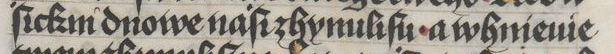ẛickni dnowe naẛi zhynuliſu.a whnieuie
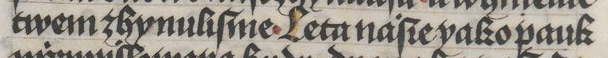twem zhynuliſme.Leta naẛie yako pauk
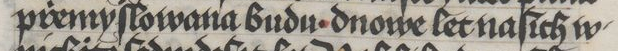pṙemyẛlowana budu.dnowe let naẛich w
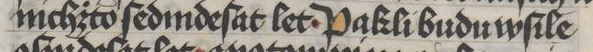nichżto ſedmdeſat let.Pakli budu wſile
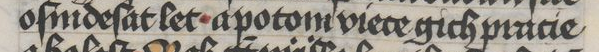oſmdeſat let.a potom viece gich pracie
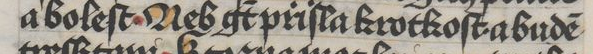a boleſt.Neb ḡt pṙiẛla krotkoſt.a budē
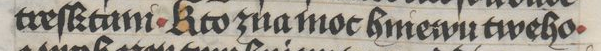treſktani.Kto zna moc hniewu tweho.
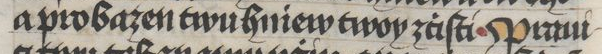a probazen twu hniew twoy zċiſtí.Praui¬
